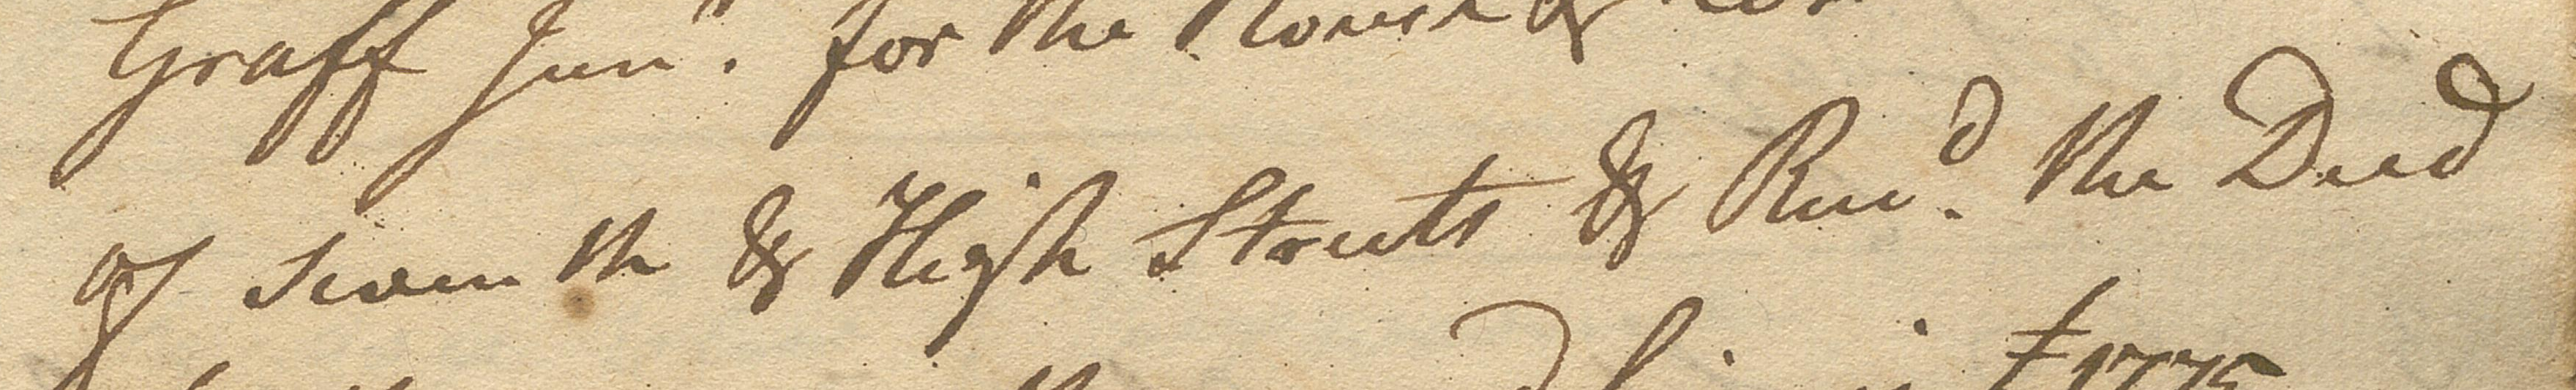of seventh & High Streets & Rec^d. the Died
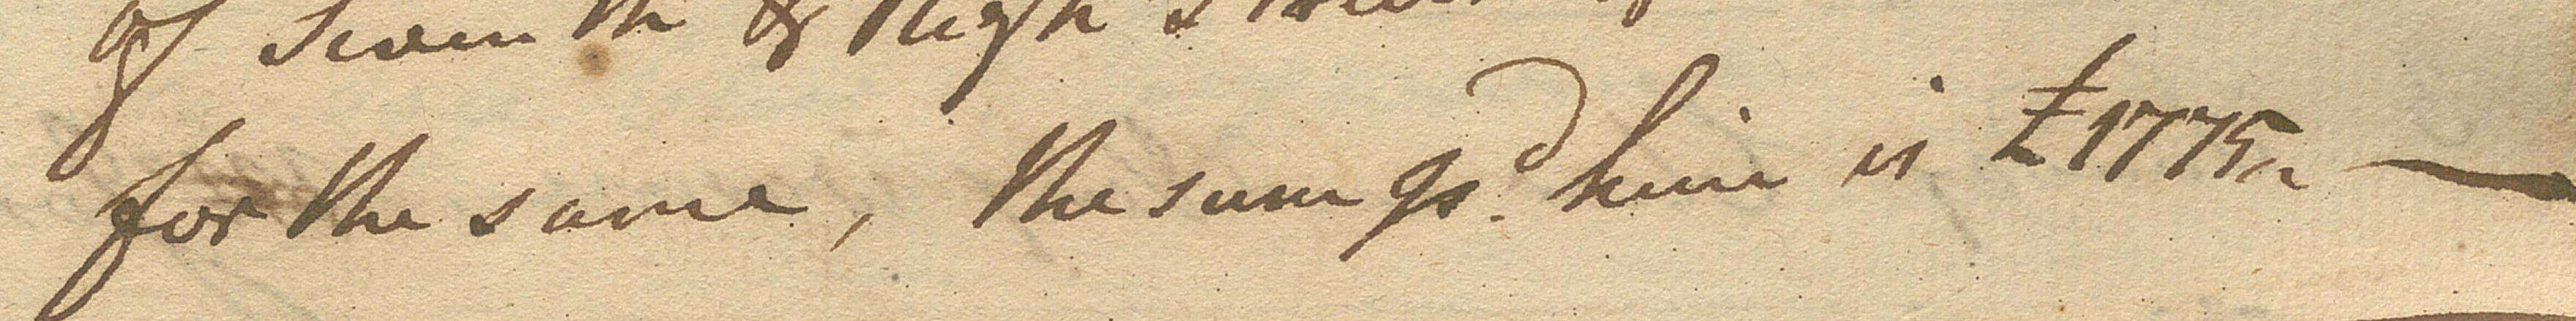for the same, the sum p^d. him is £1775-
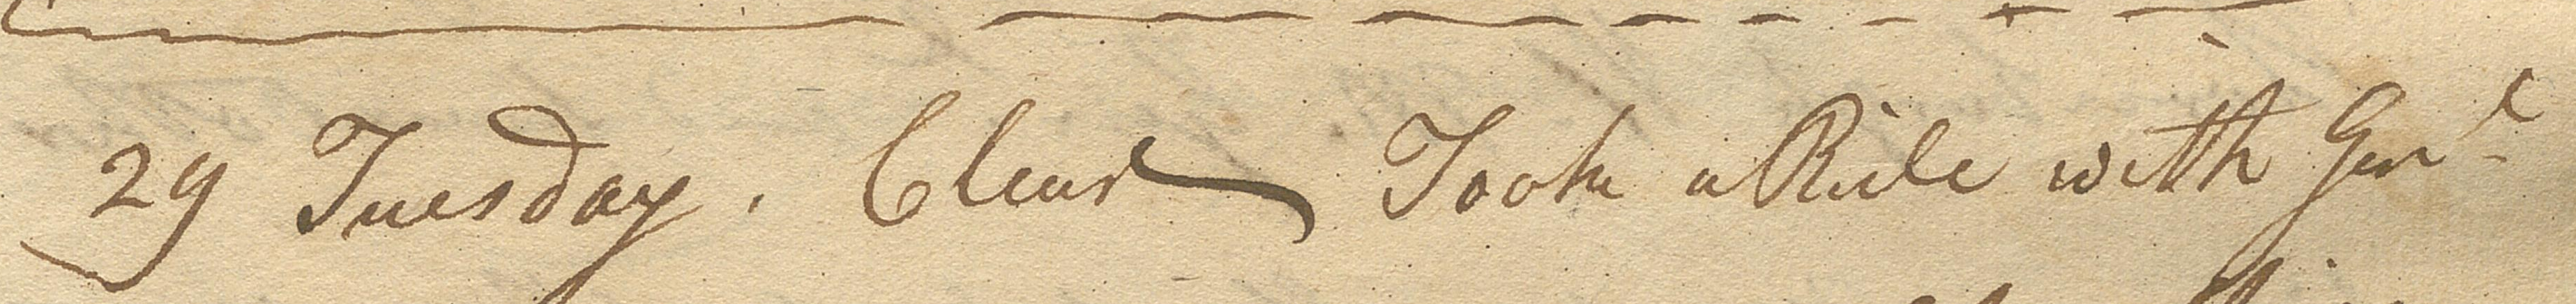29 Tuesday. Clear Took a Ride with Gen^l
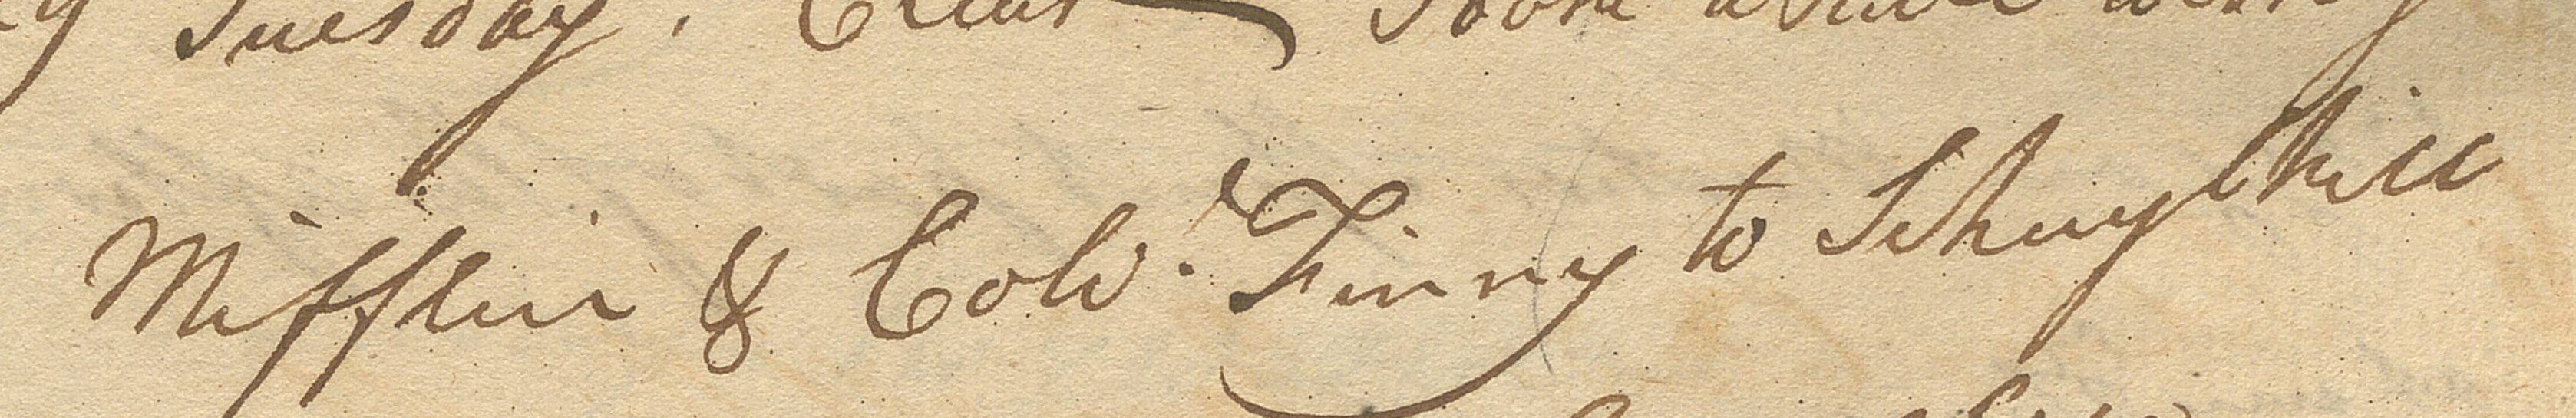Mifflin & Colo^l. Finny to Schuylkill
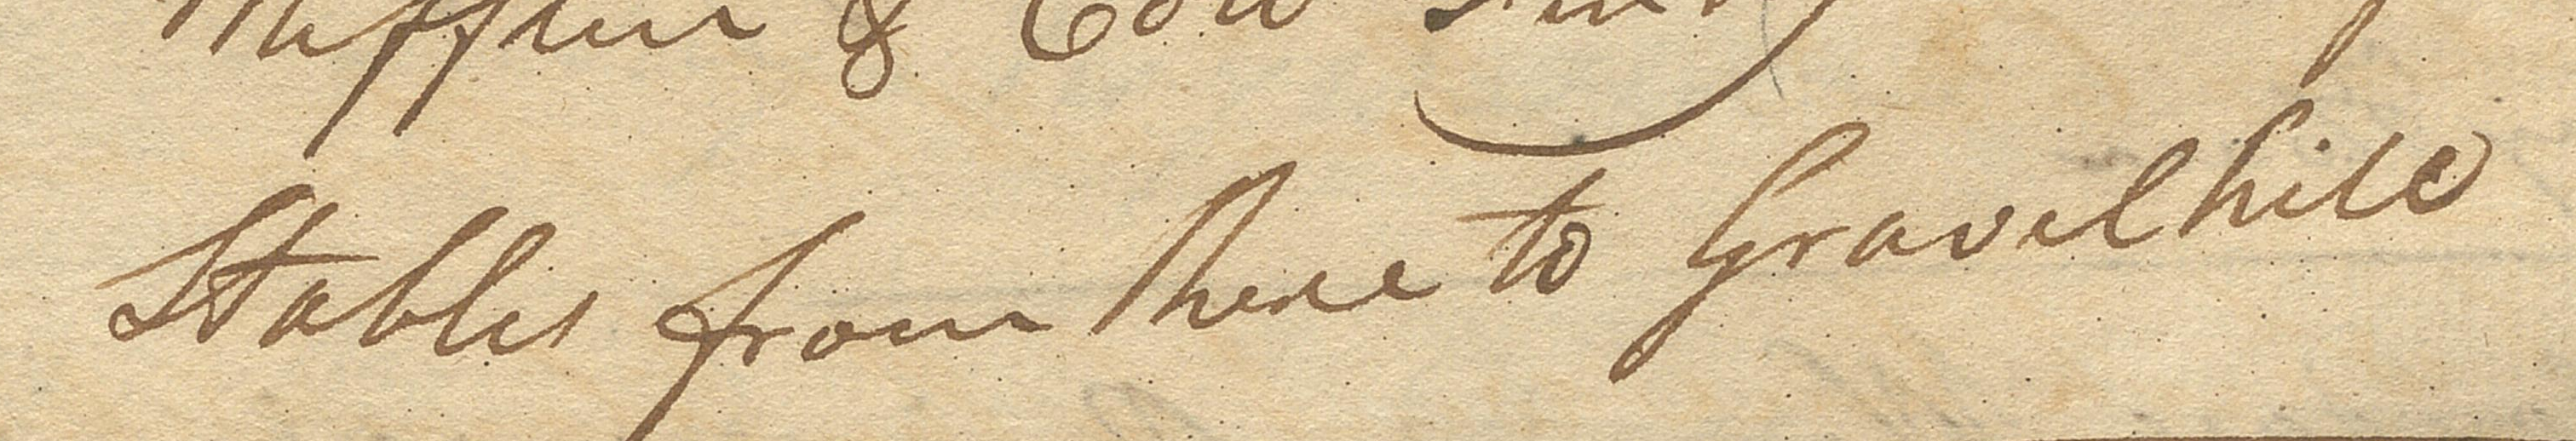Stables from there to Gravelhill
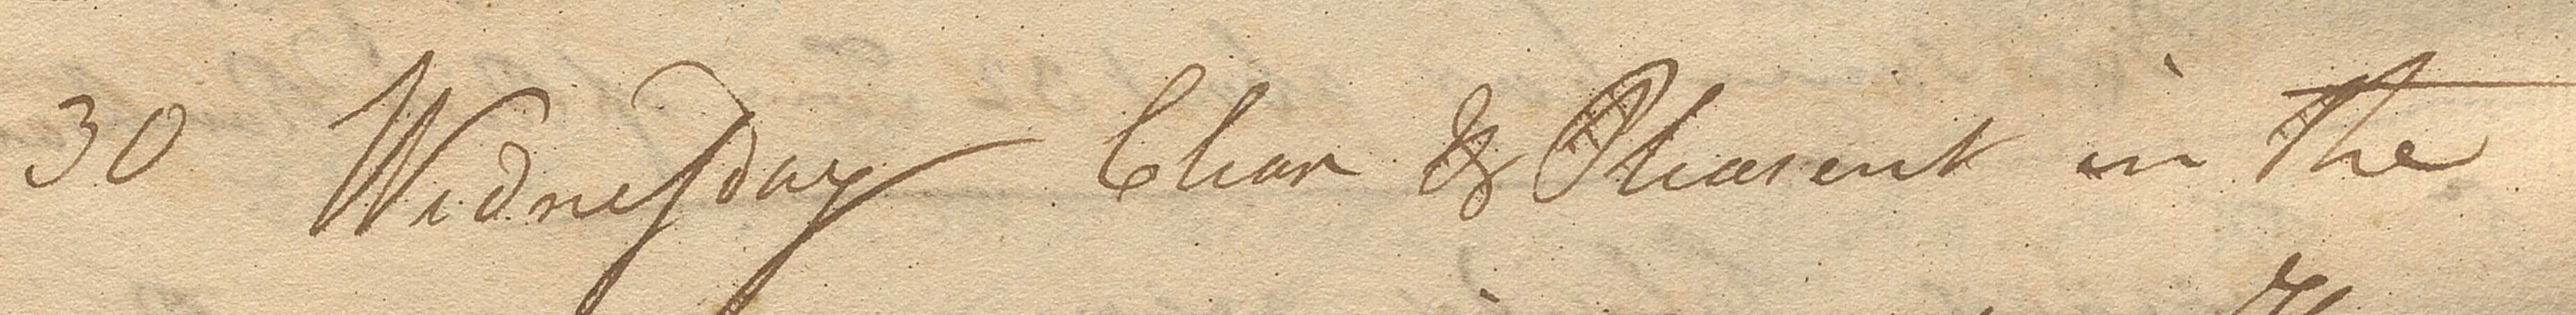30 Wednesday Clear & Pleasent in the
